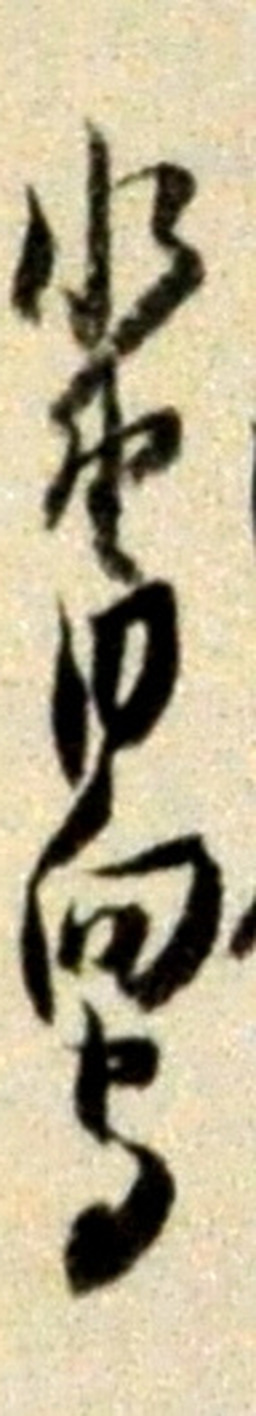水野日向守
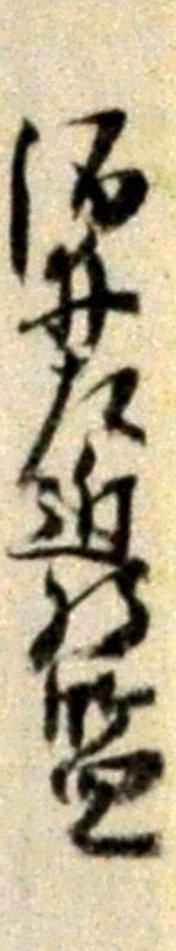酒井左近将監
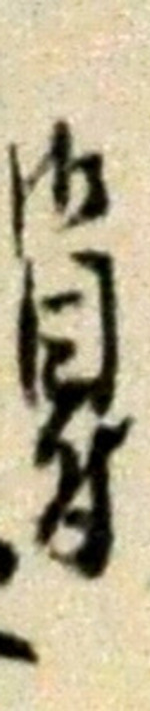御目付
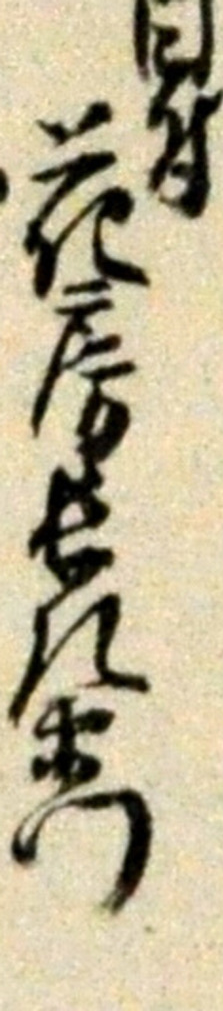花房長左衛門
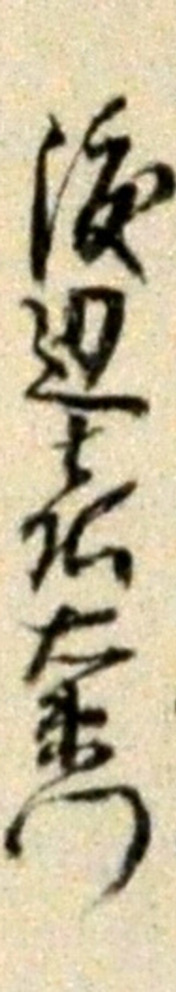渡辺嘉右衛門
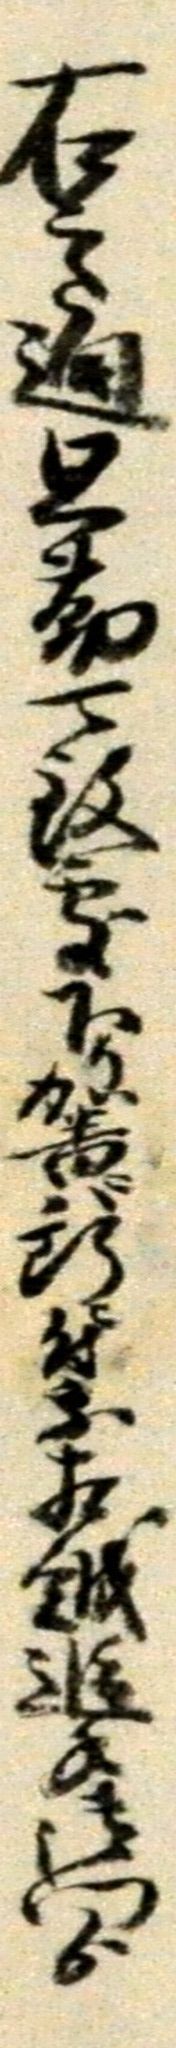右之通廻勤可致處下り加番ㇵ頭二付等相越追手御門ゟ
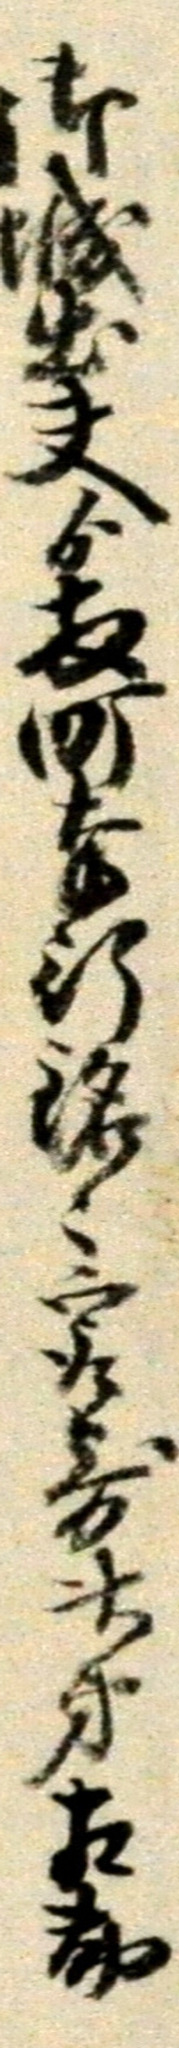御城出夫ゟ両町奉行所銘々最寄次第相勤
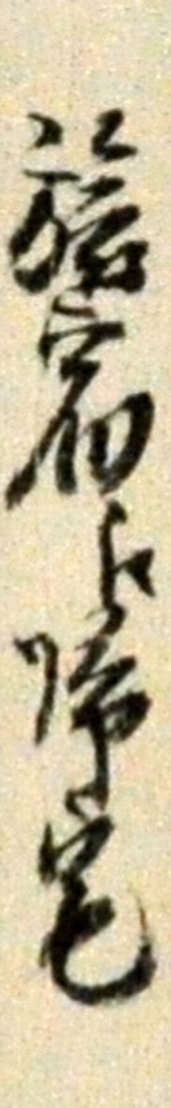旅宿江帰宅
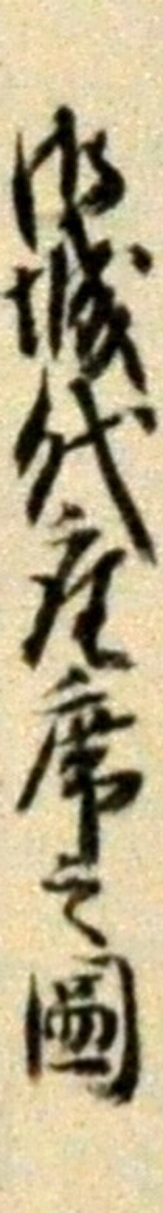御城代座席之図
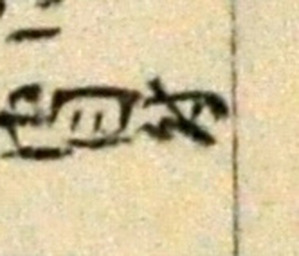御目付

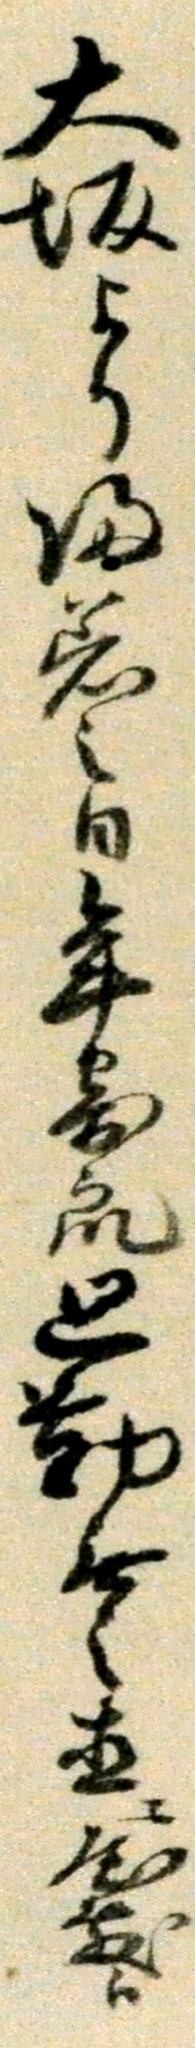大坂より帰着之日年寄衆廻勤無之直二屋敷江
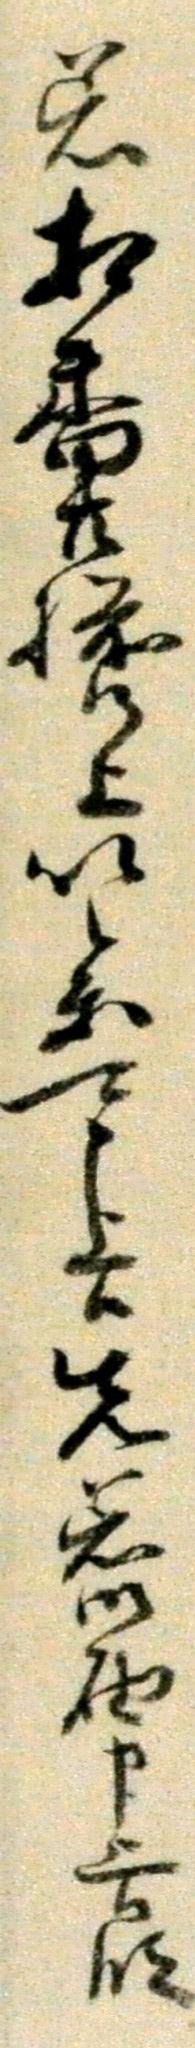着相番共揃候上以参可申上候先着御届申上候段
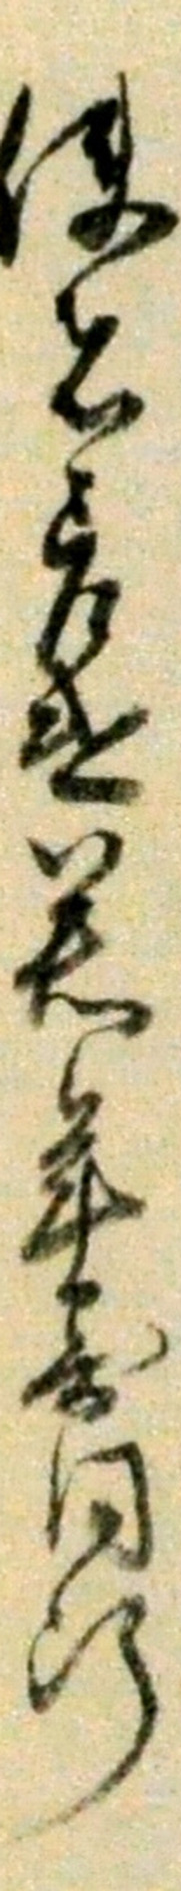使者差遣着年寄同断
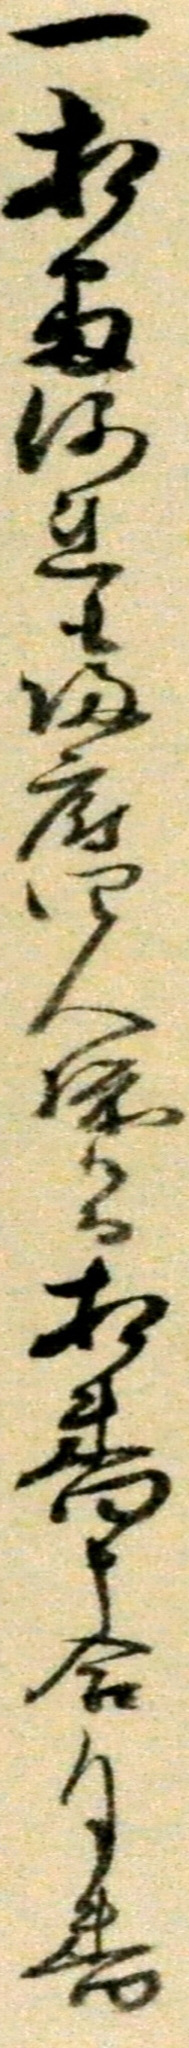一相番何連も帰府四人揃候而相番申合月番
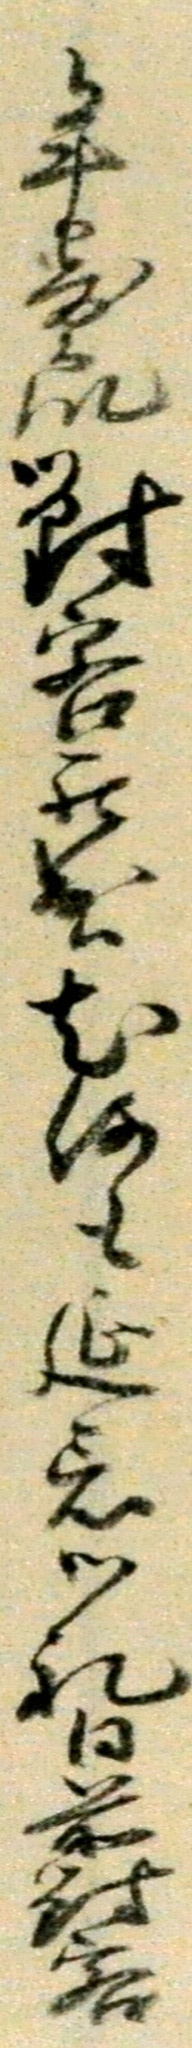年寄衆対客罷出候尤何も延着御礼日前対客
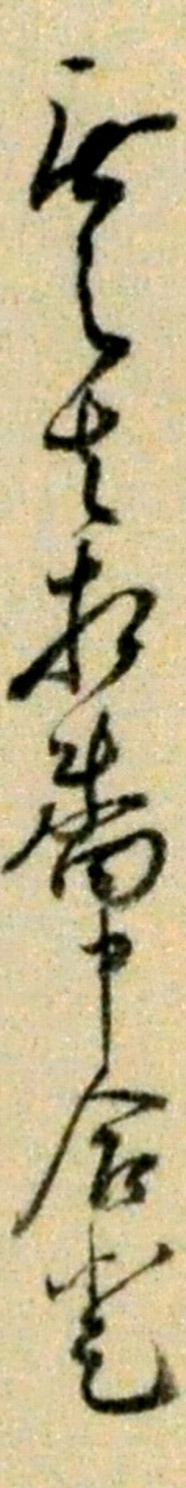無之者相番申合登
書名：大阪加番関係諸書留〔一括〕
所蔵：伊那市立高遠町図書館・合同会社AMANE
